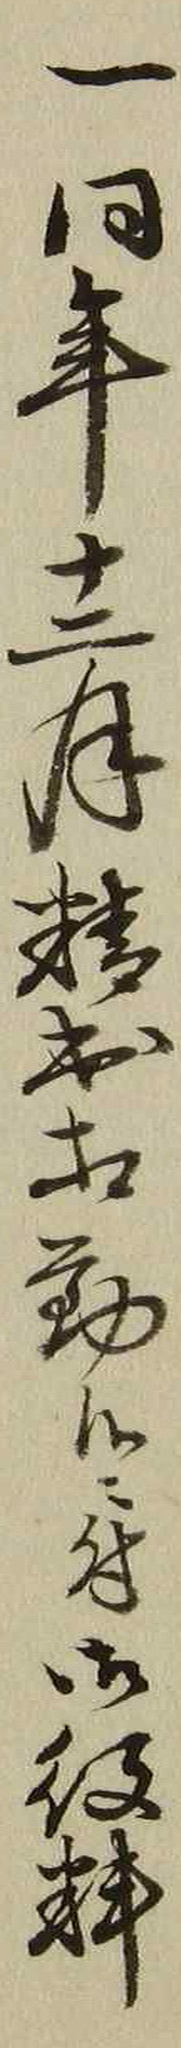一同年十二月精出相勤候ニ付御役料
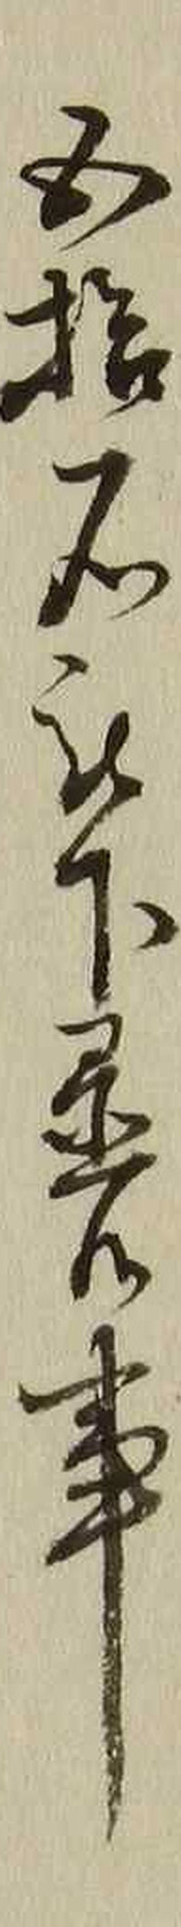五拾石被下置候事
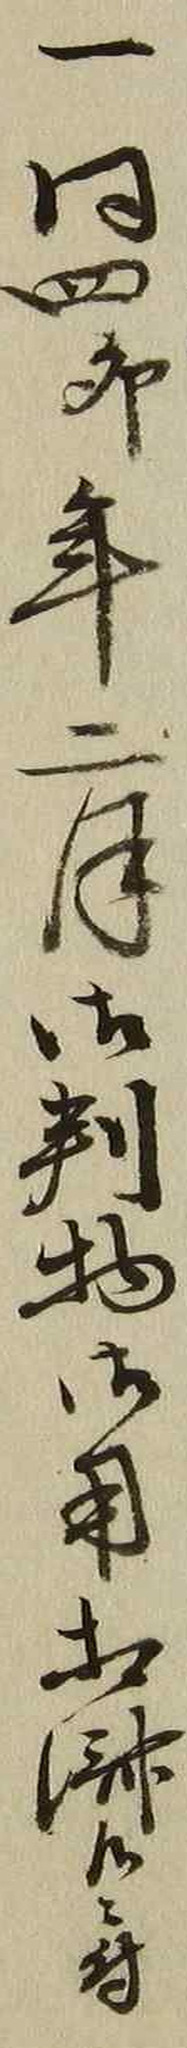一同四卯年二月御判物御用相済候ニ付
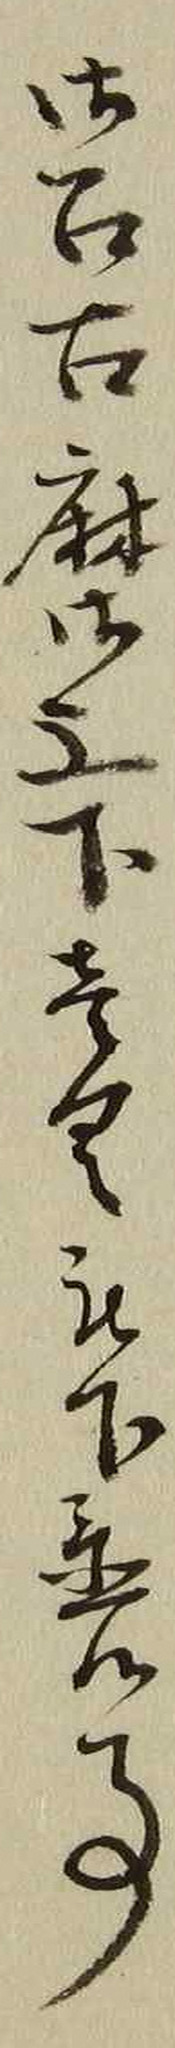御召古麻上下壱具被下置候事
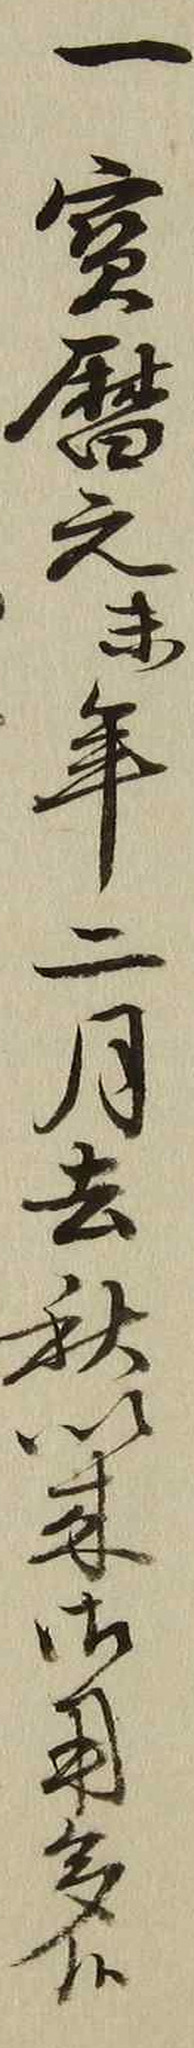一宝暦元未年二月去秋以来御用多候
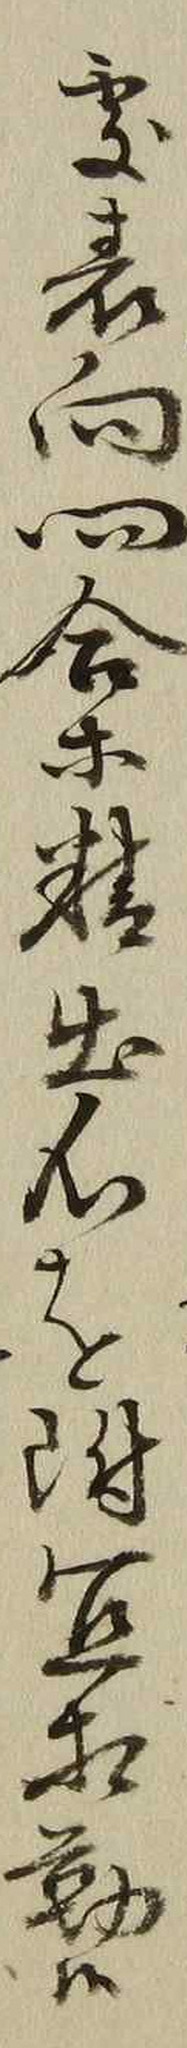処表向問合等精出心を附宜相勤候
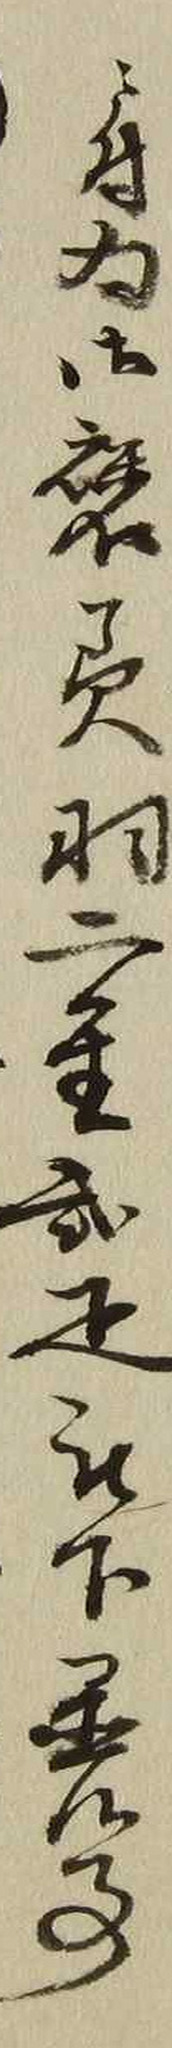ニ付為御褒美羽二重弐疋被下置候事
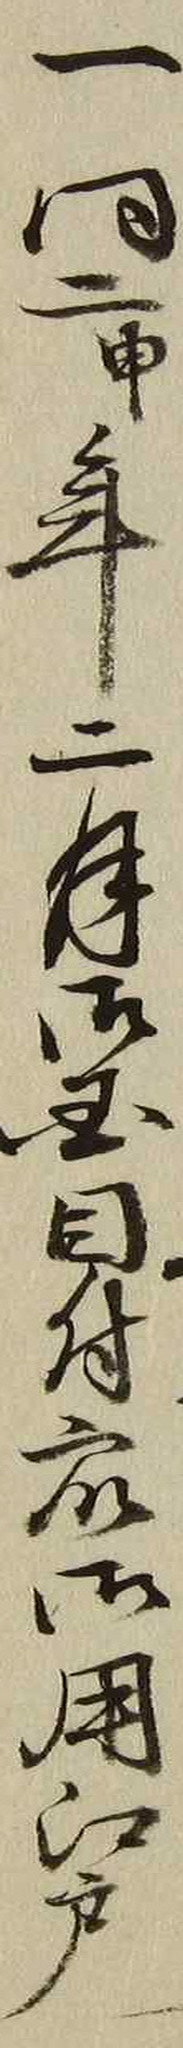一同二申年二月御国目付衆御用江戸
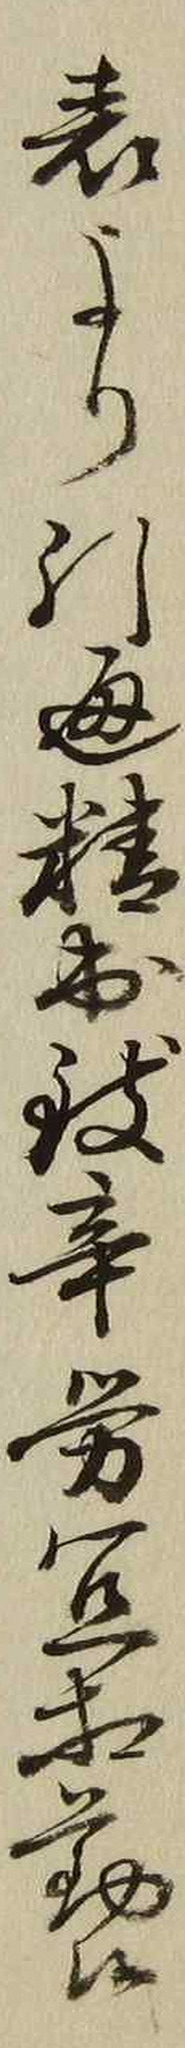表より引通精出致辛労宜相勤候
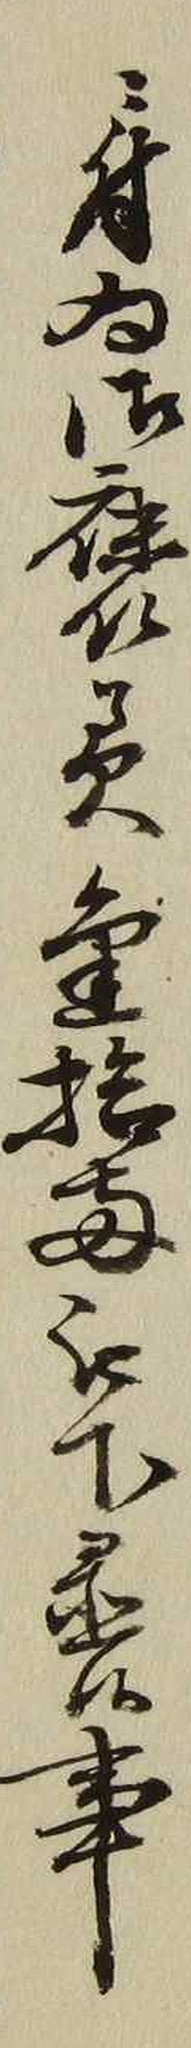ニ付為御褒美金拾両被下置候事
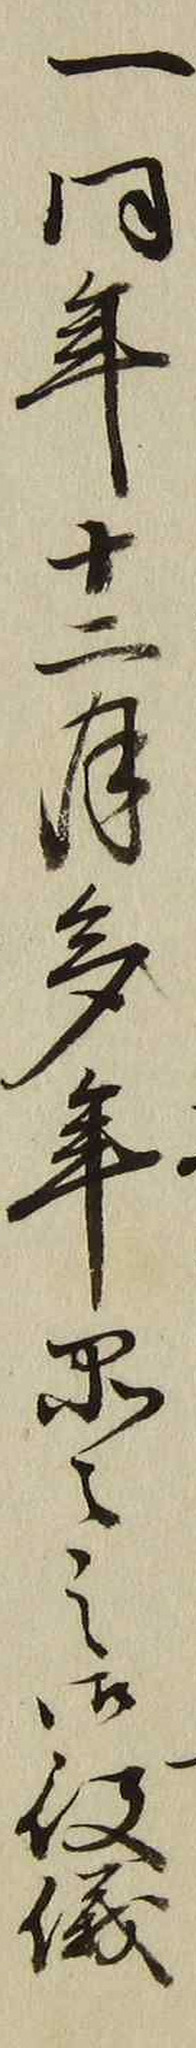一同年十二月多年品々之御役儀
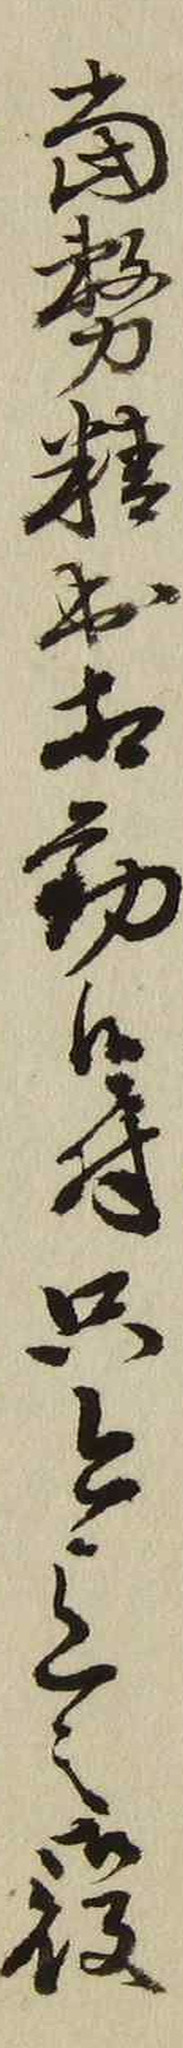当務精出相勤候ニ付只今迄之御役
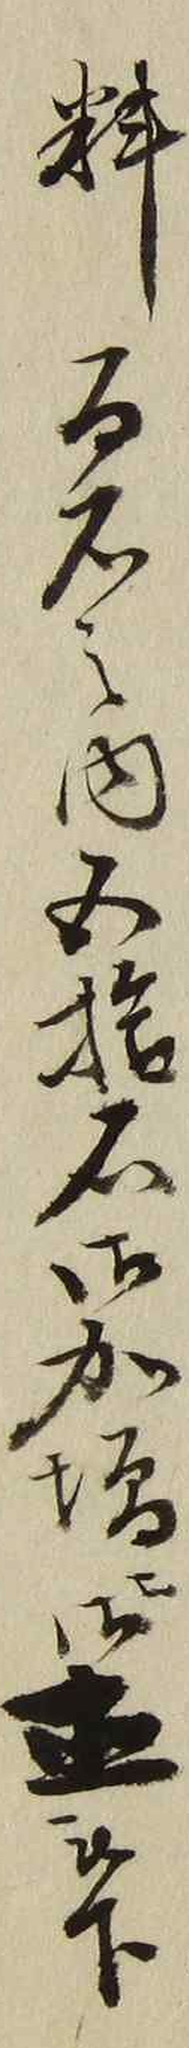料百石之内五拾石御加増ニ御直被下
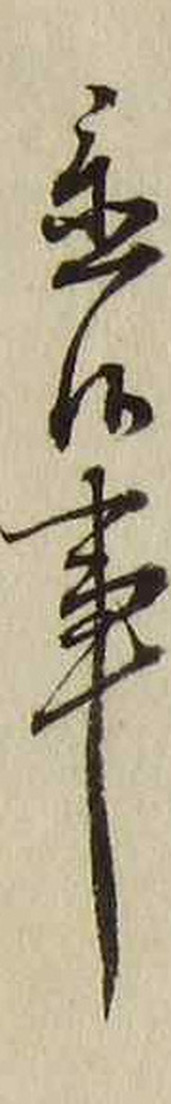置候事

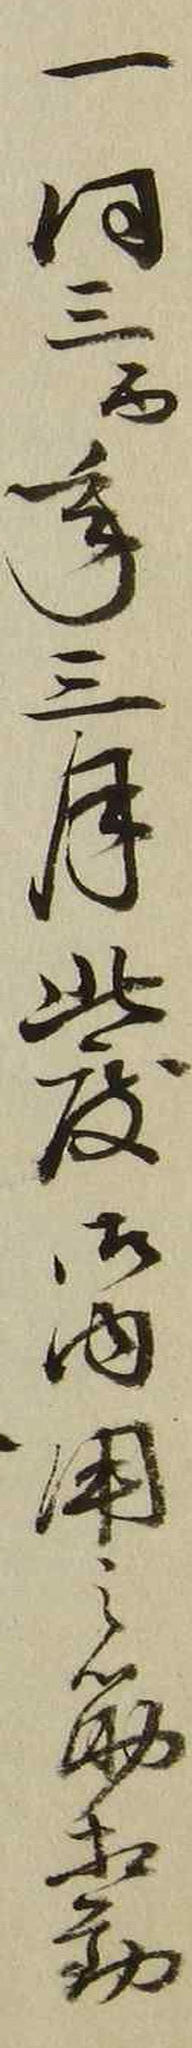一同三酉年三月此度御内用之筋相勤
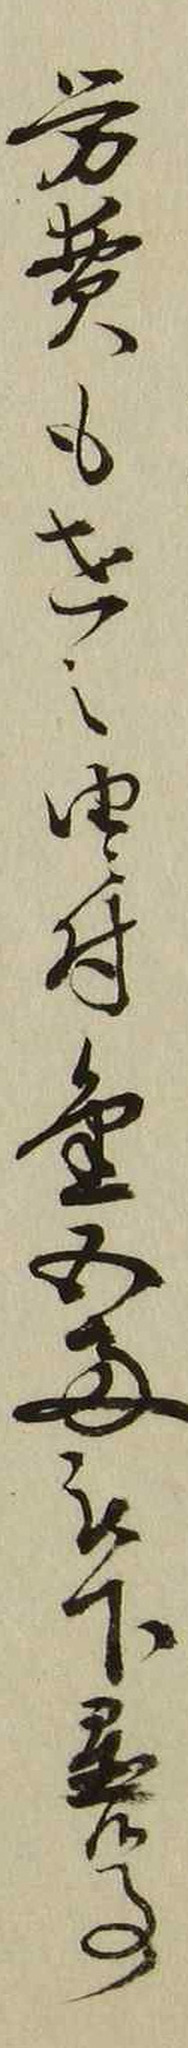労費も遣之由ニ付金五両被下置候事
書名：諸士系譜　巻之35　は之部3
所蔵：会津若松市立会津図書館
